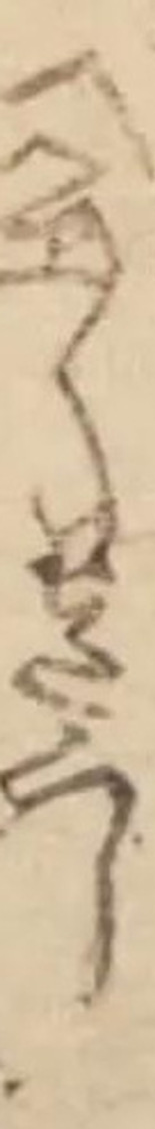「へヱ〳〵わたくし
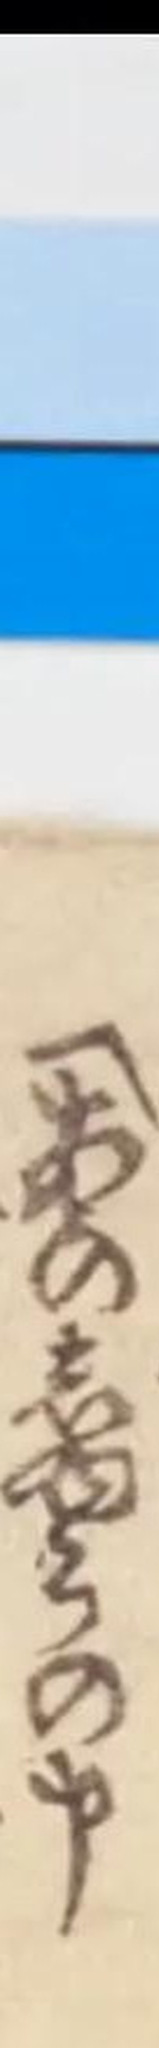「あのしゆうの申
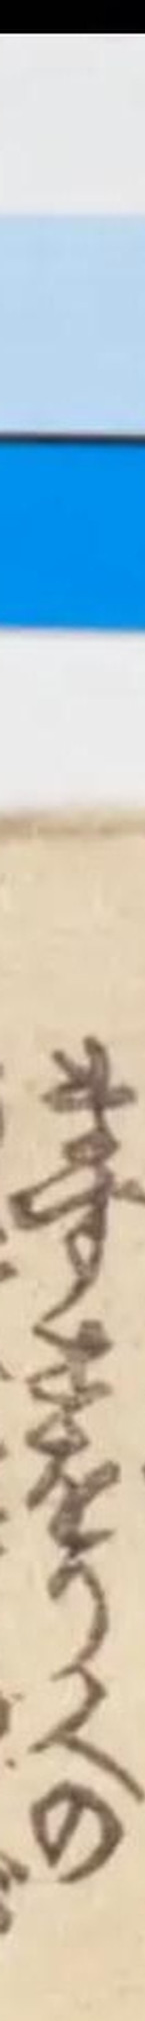ますとをり人の
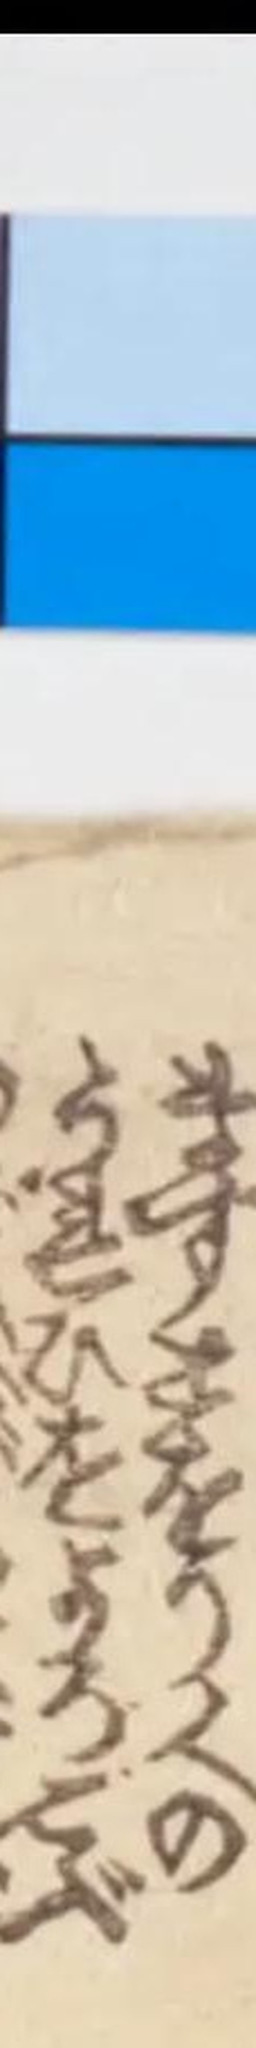うれひをよろこぶ
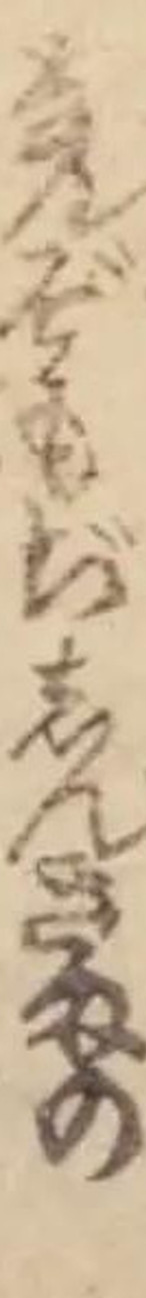なんぞもぢしんさまの
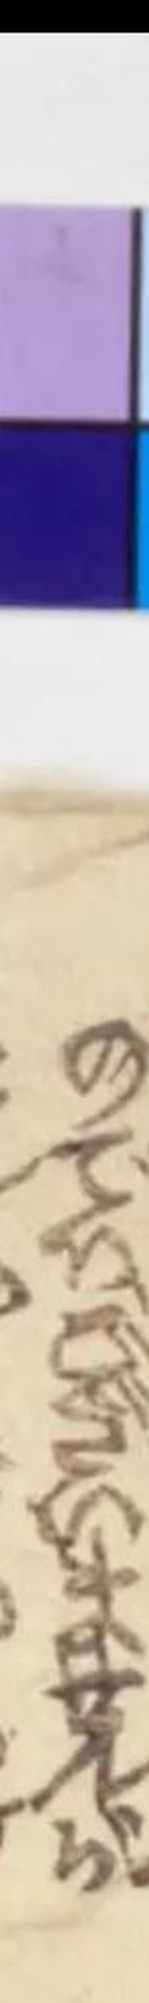のではございませんが
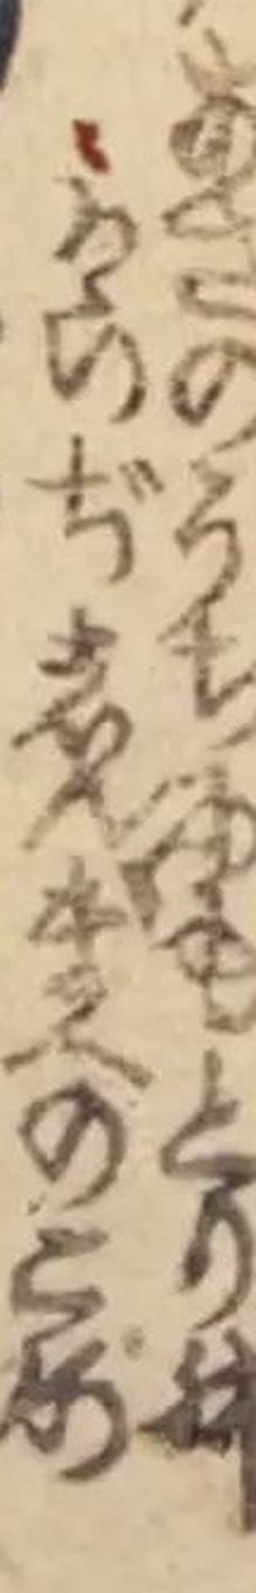からぢしんまへのこめ
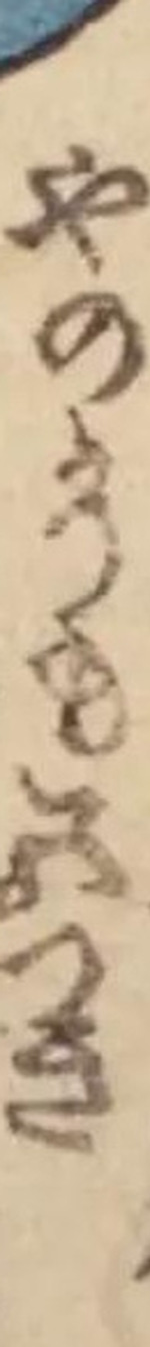やのかりも五つき
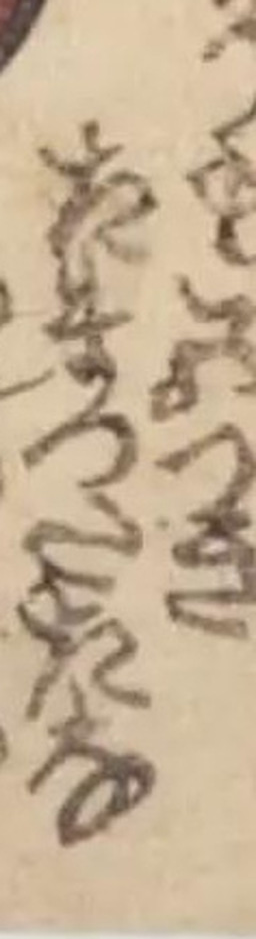たまつたな
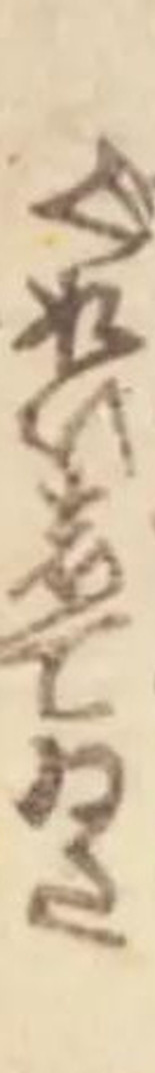ぐれいしてゐた
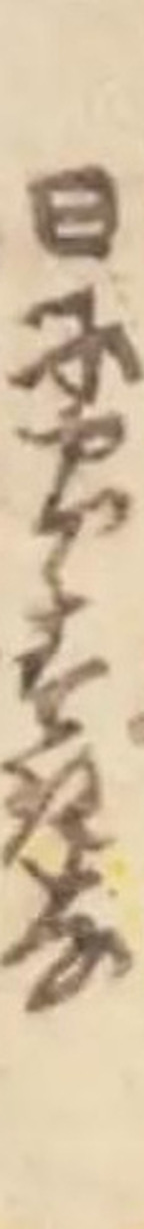日にやアすきな
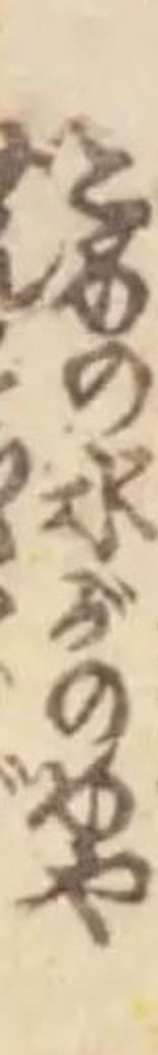こめの水がのめや
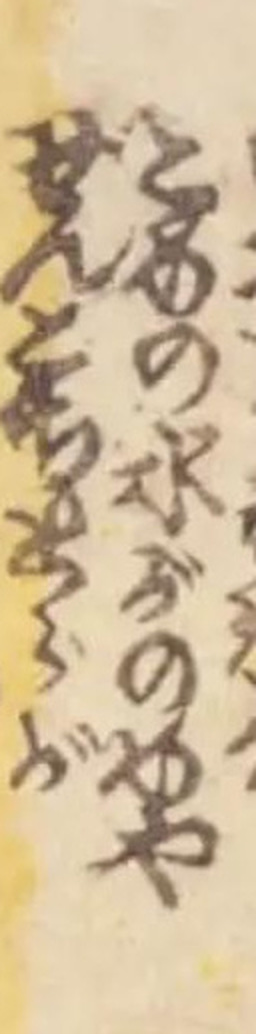せんこちとらが
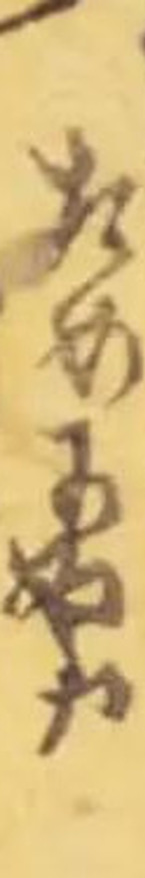ためにやア
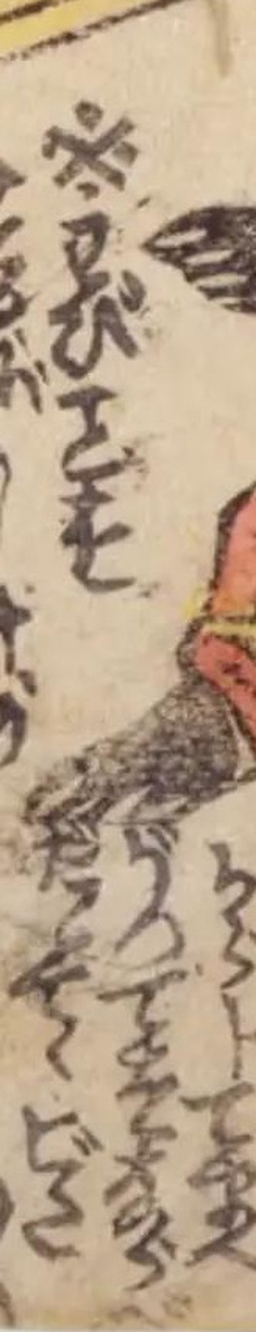※わびことを
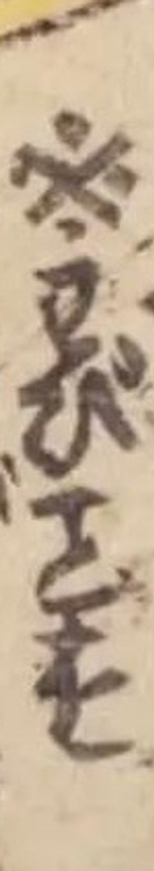※わびことを
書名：生捕ました三度の大地震
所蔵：国立国会図書館 National Diet Library, JAPAN
